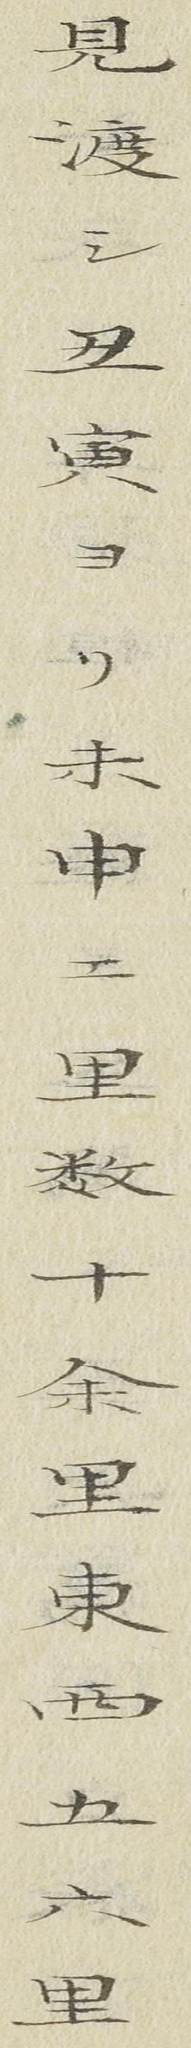見渡シ丑寅ヨリ未申ニ里数十余里東西五六里
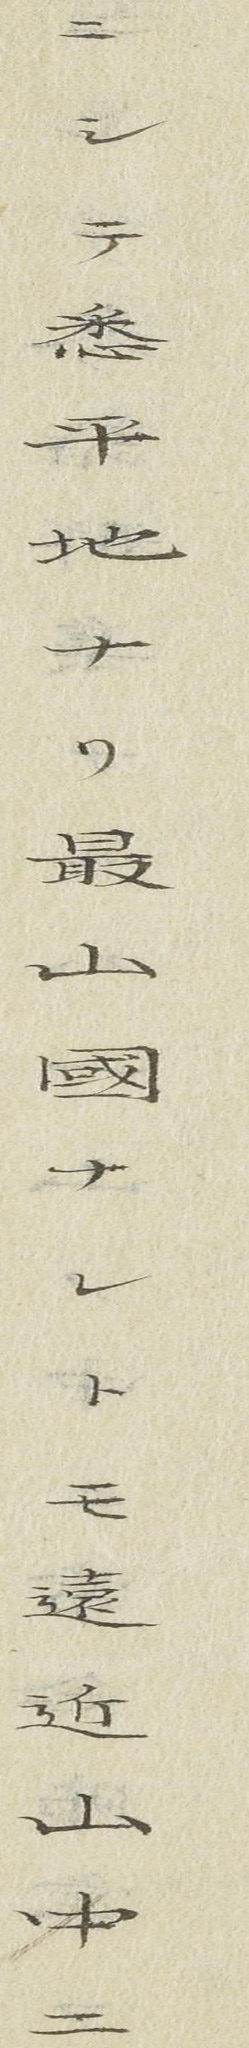ニシテ悉平地ナリ最山国ナレトモ遠近山中ニ
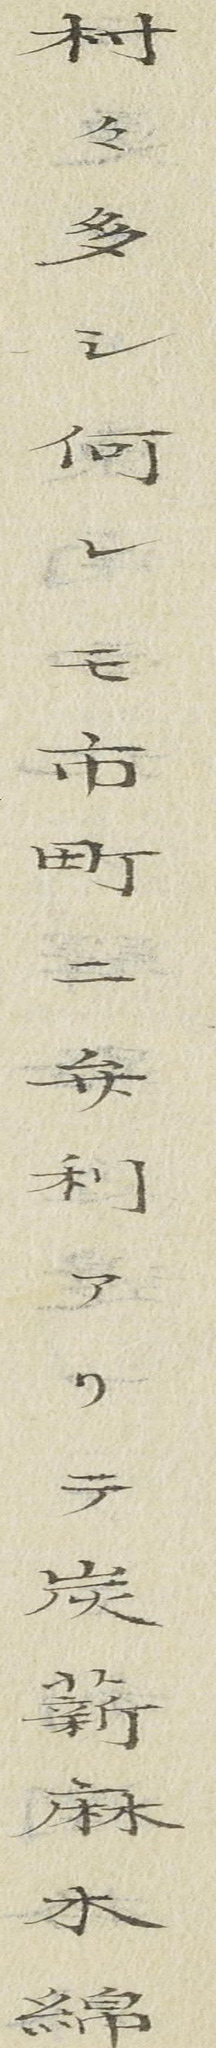村々多シ何レモ市町ニ弁利アリテ炭薪麻木綿
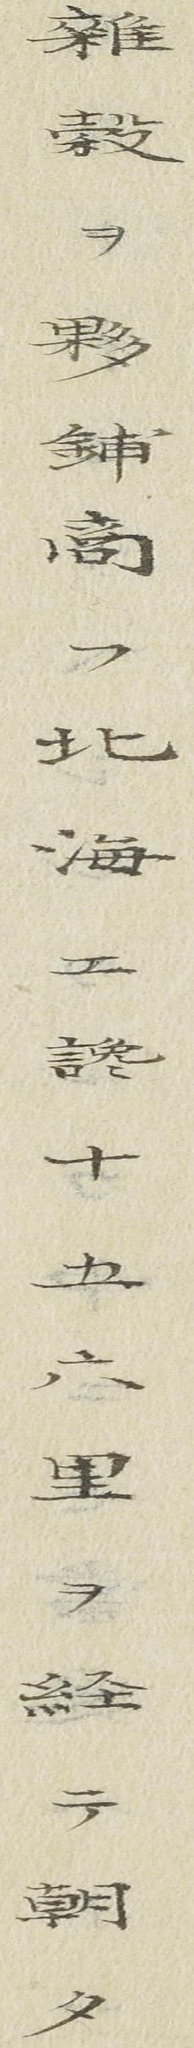雑穀ヲ夥鋪商フ北海エ讒十五六里ヲ経テ朝夕
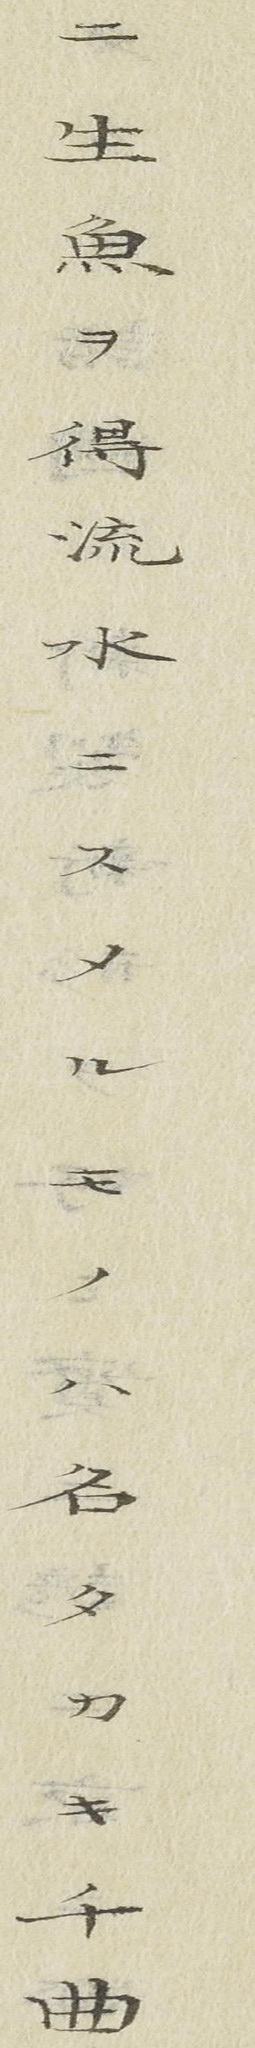ニ生魚ヲ得流水ニスメルモノハ名タカキ千曲
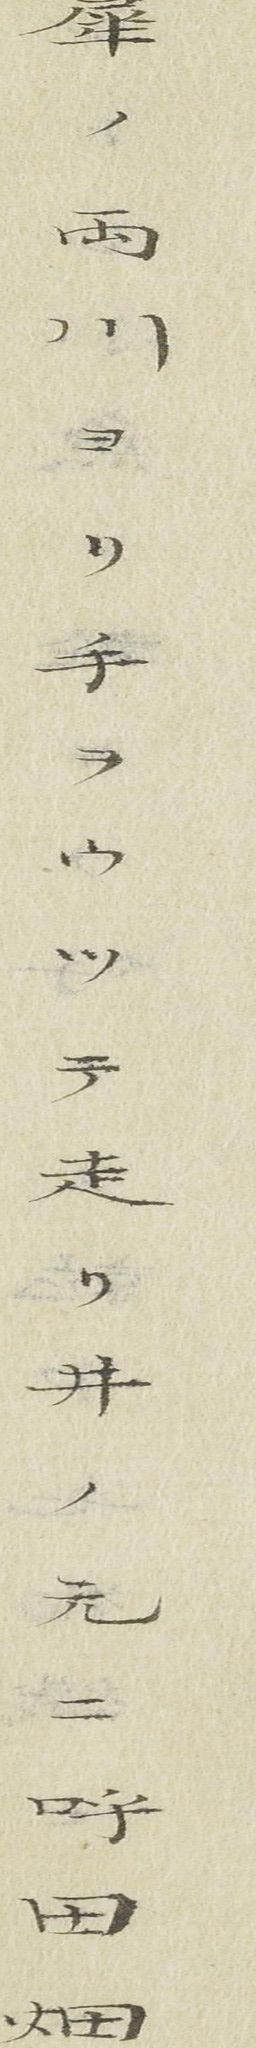犀ノ両川ヨリ手ヲウツテ走リ井ノ元ニ呼田畑
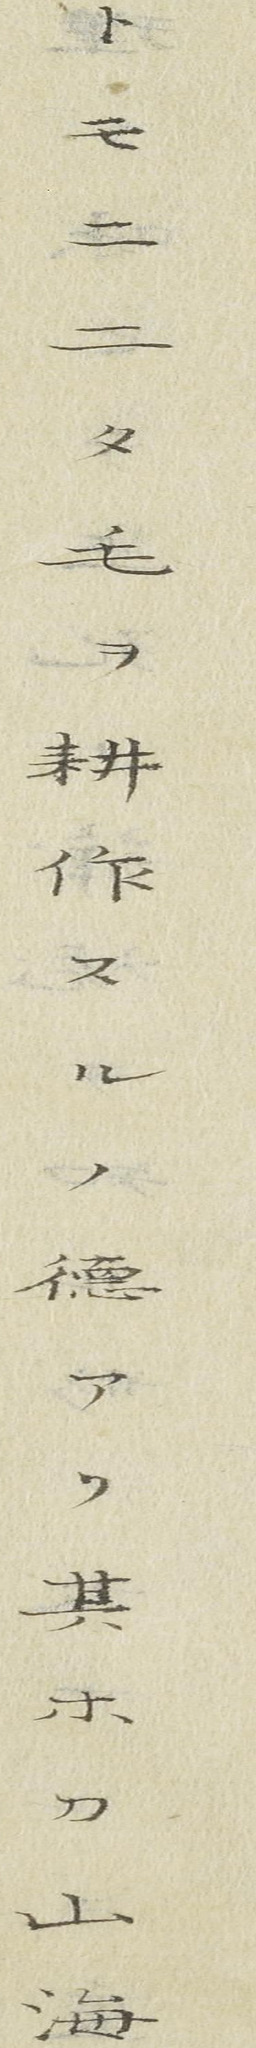トモニ二タ毛ヲ耕作スルノ徳アリ其ホカ山海
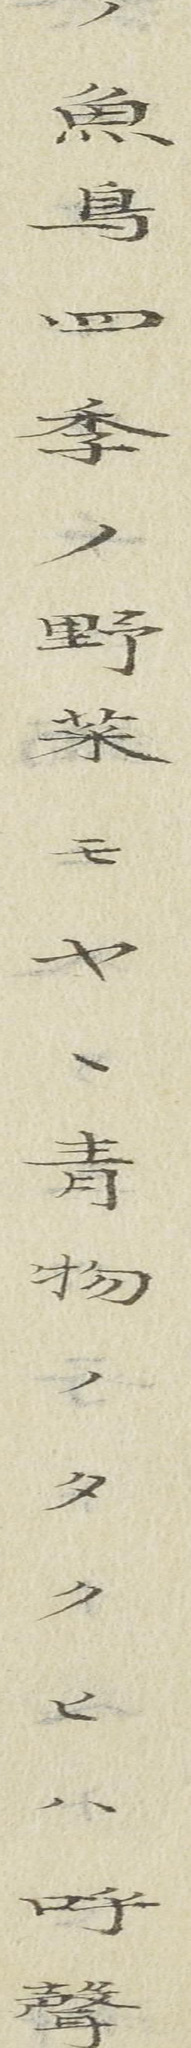ノ魚鳥四季ノ野菜モヤヽ青物ノタクヒハ呼声

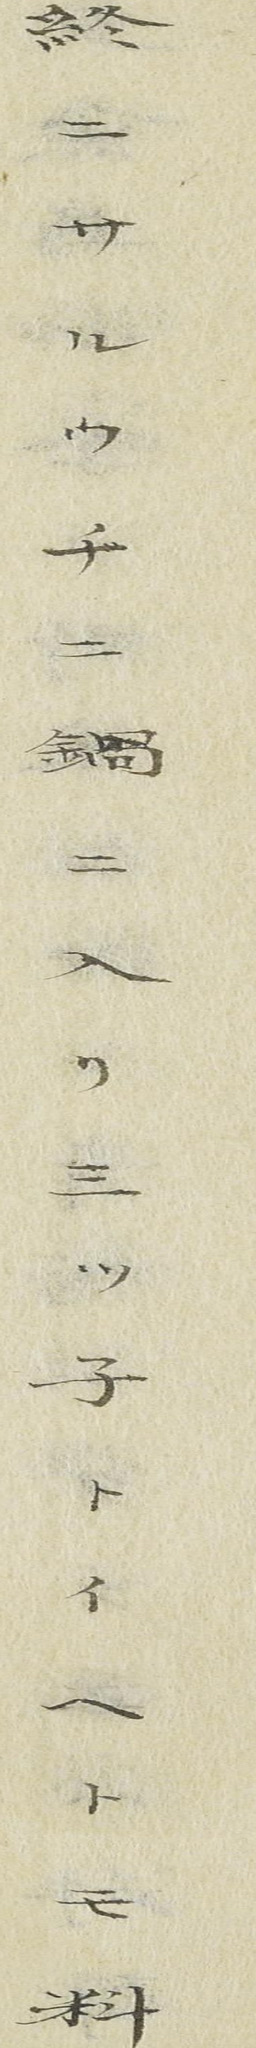終ニサルウチニ鍋ニ入リ三ツ子トイヘトモ料
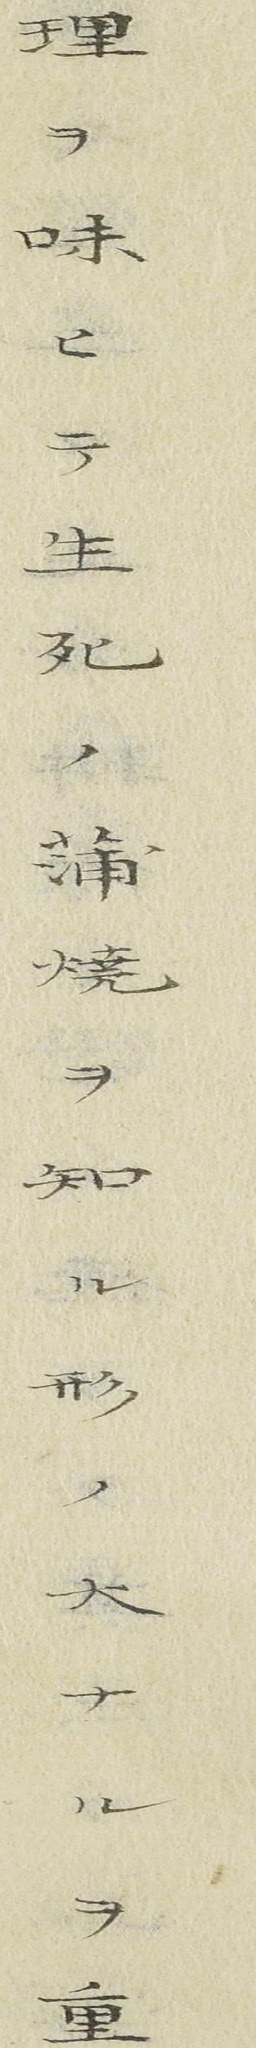理ヲ味ヒテ生死ノ蒲焼ヲ知ル形ノ大ナルヲ重
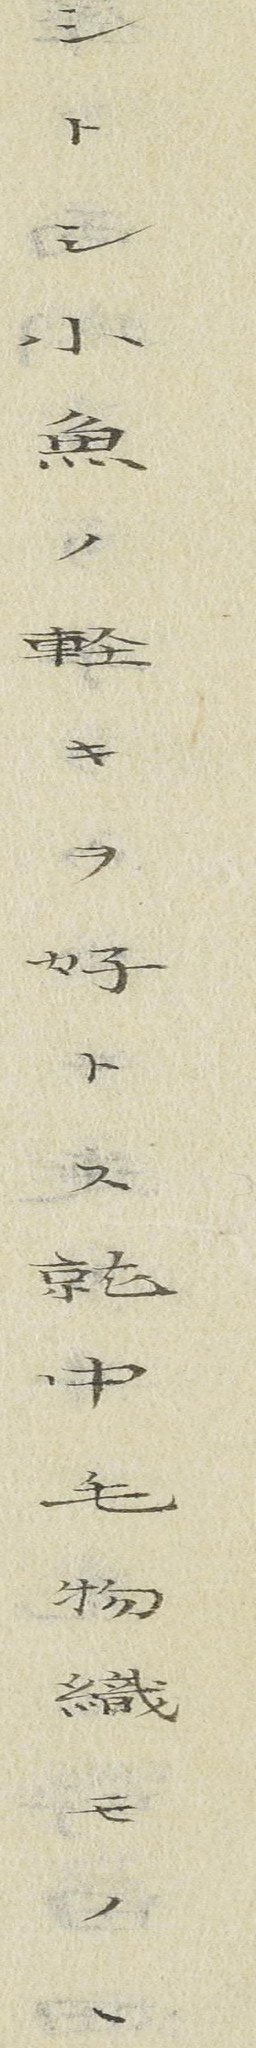シトシ小魚ノ軽キヲ好トス就中毛物織モノヽ
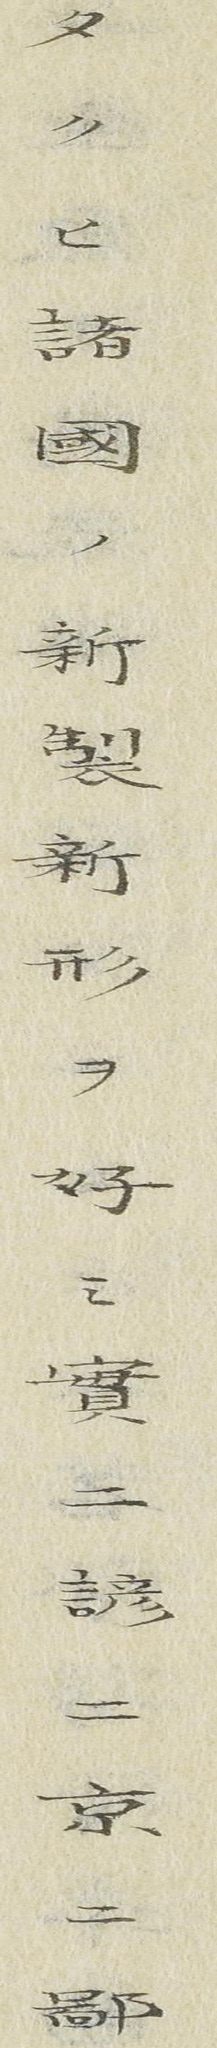タクヒ諸国ノ新製新形ヲ好ミ実ニ諺ニ京ニ鄙
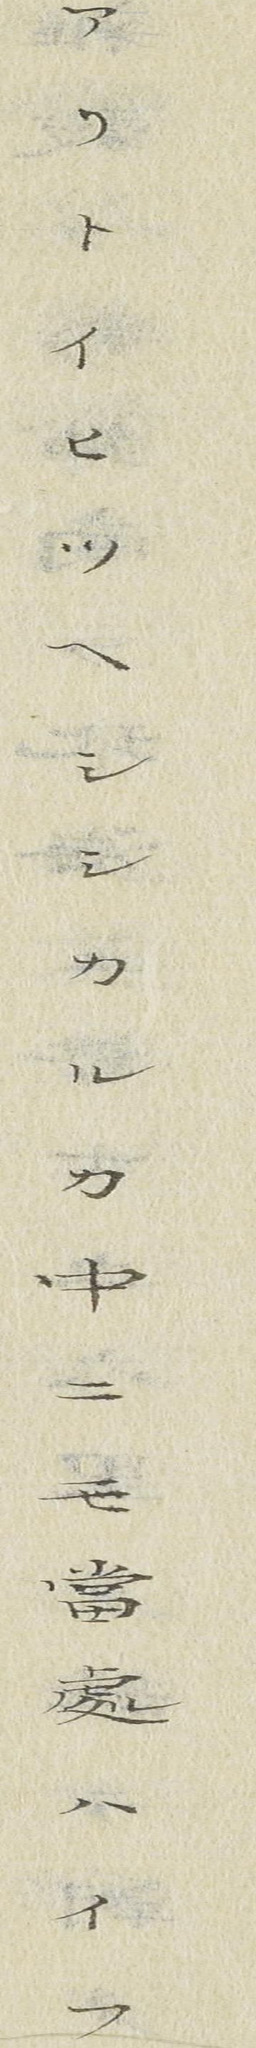アリトイヒツヘシシカルカ中ニモ当処ハイフ
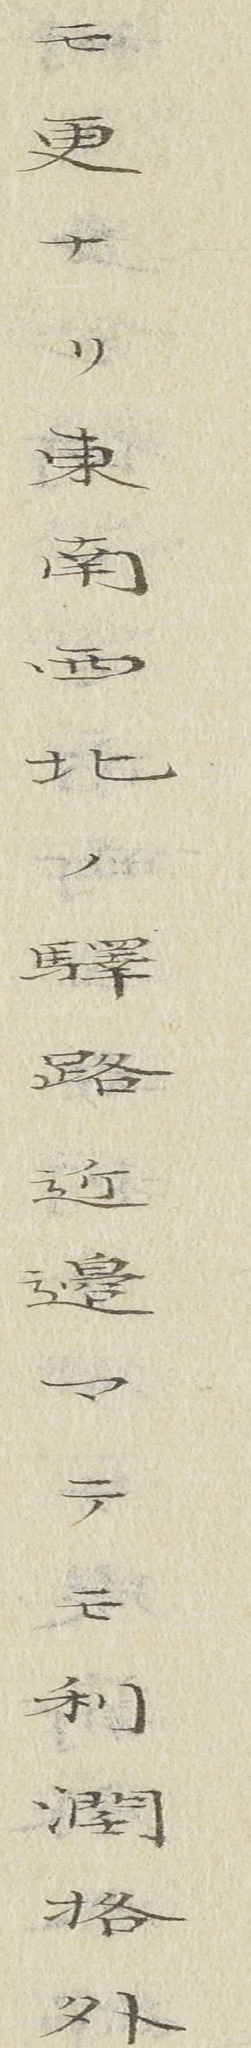モ更ナリ東南西北ノ駅路近辺マテモ利潤格外
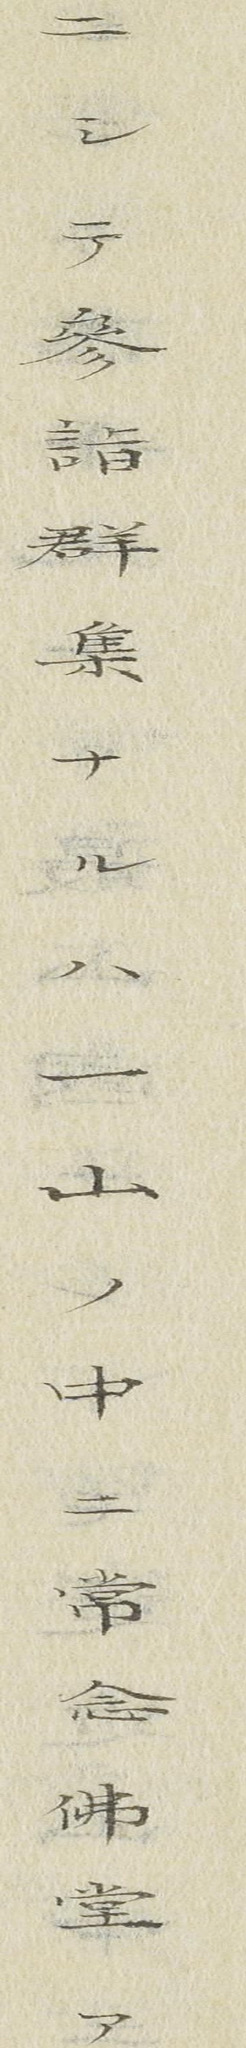ニシテ参詣群集ナルハ一山ノ中ニ常念仏堂ア
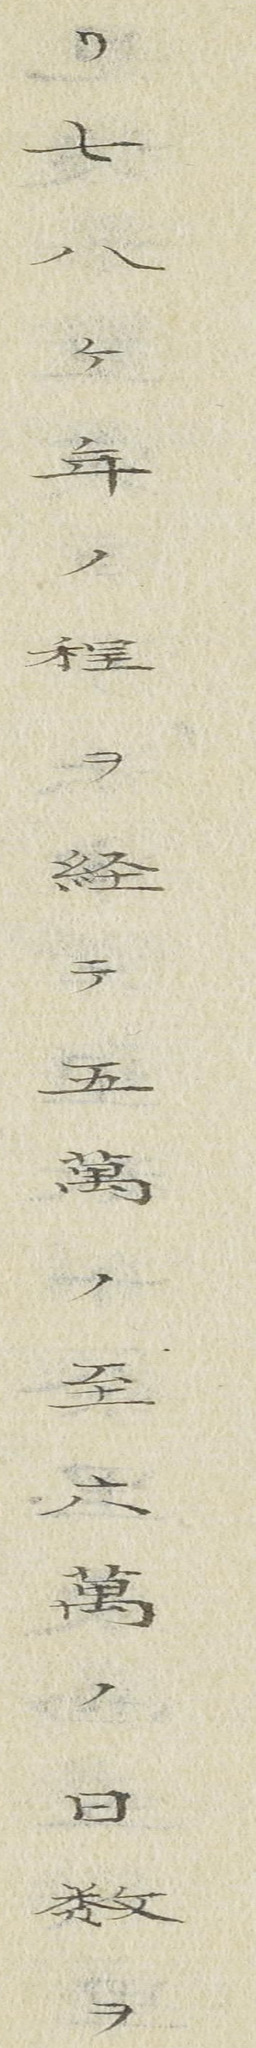リ七八ケ年ノ程ヲ経テ五万ノ至六万ノ日数ヲ
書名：地災撮要　地震之部　巻ノ二
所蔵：東京大学地震研究所図書室 Earthquake Research Institute Library, The University of Tokyo, JAPAN
